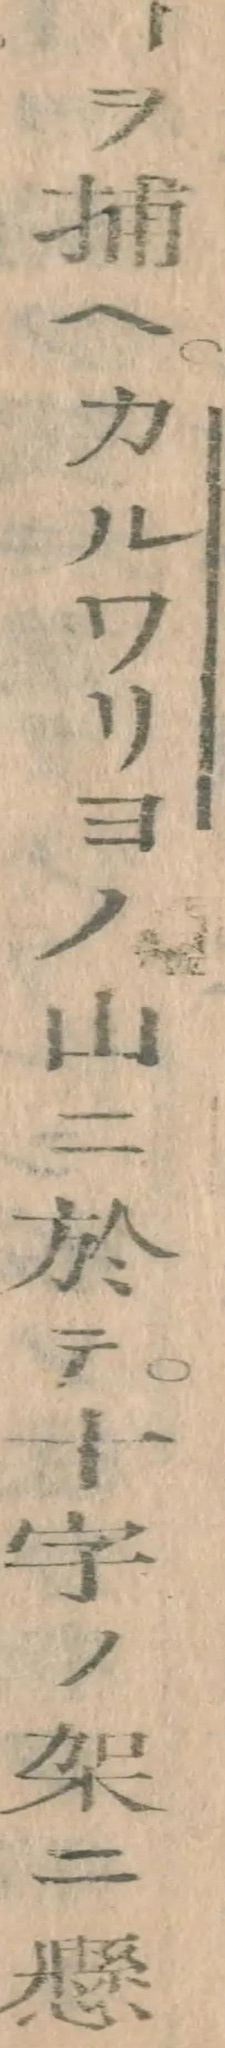トヲ捕ヘ。カルワリヨノ山ニ於テ。十字ノ架ニ懸
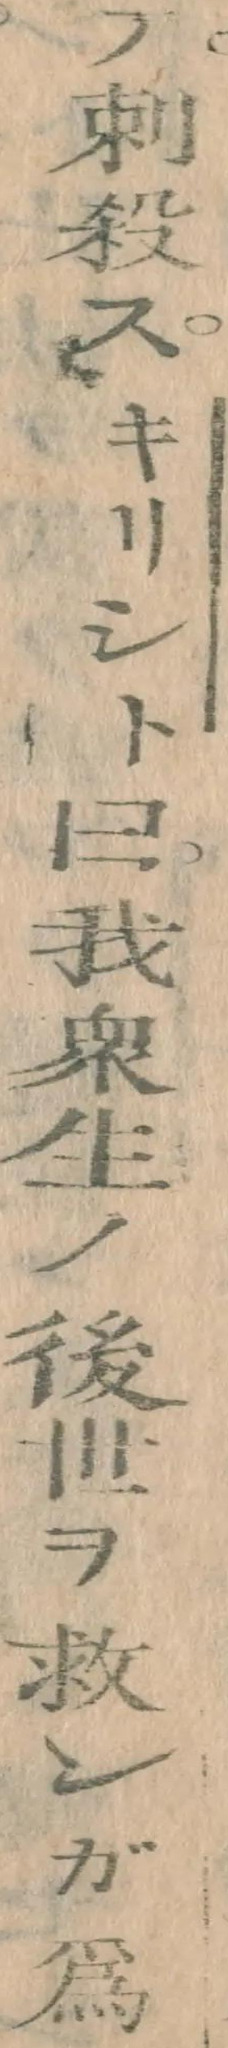テ。刺殺ス。キリシト曰。我衆生ノ後世ヲ救ンガ為
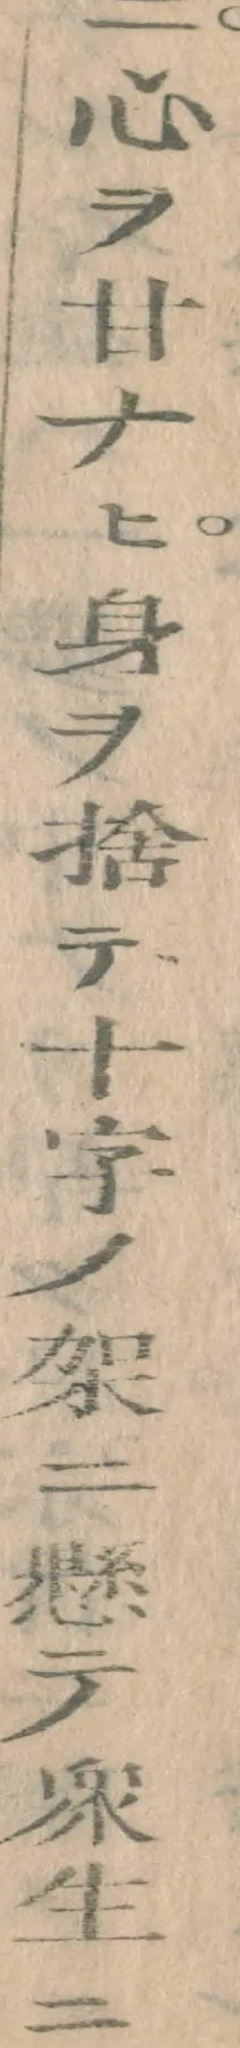ニ。心ヲ甘ナヒ。身ヲ捨テ十字ノ架ニ懸テ衆生ニ
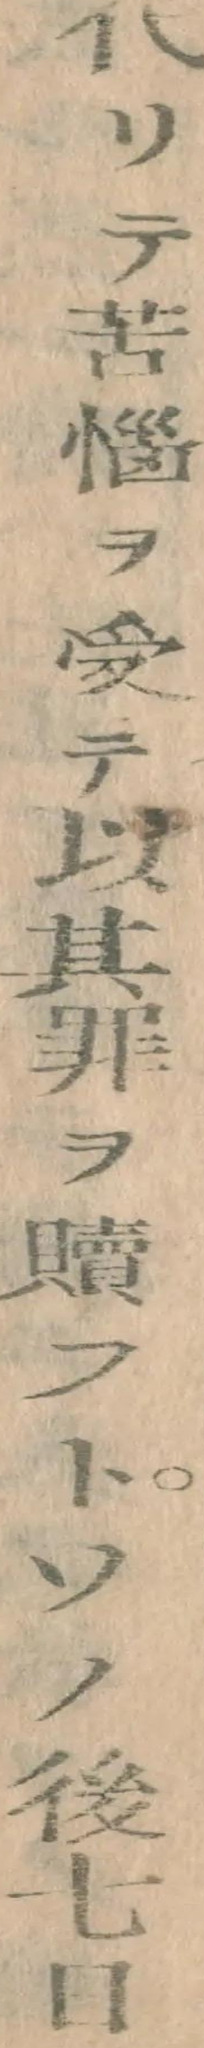代リテ苦悩ヲ受テ。以其罪ヲ贖フト。ソノ後七日
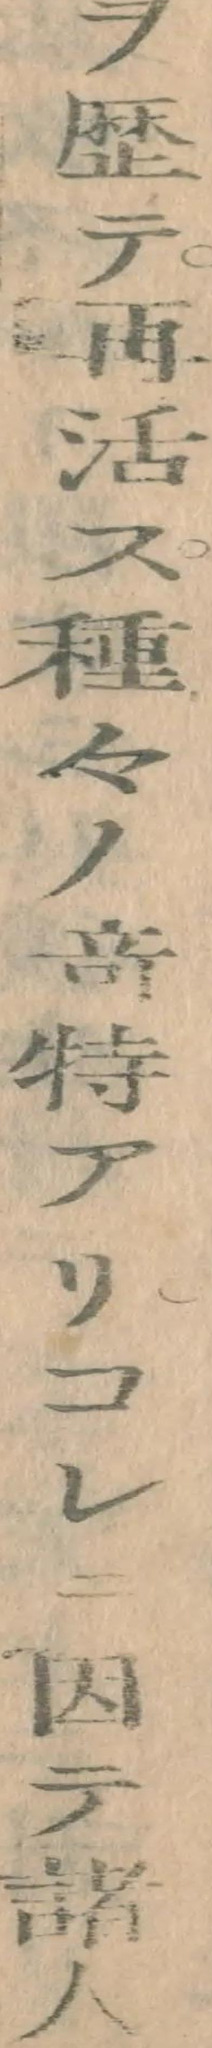ヲ歴テ。再活ス。種々ノ奇特アリ。コレニ因テ諸人

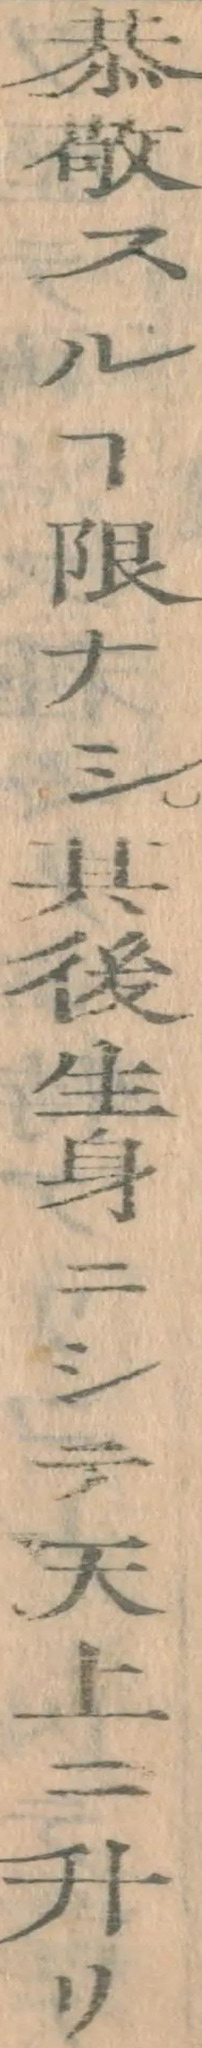恭敬スルヿ限ナシ。其後生身ニシテ天上ニ升リ
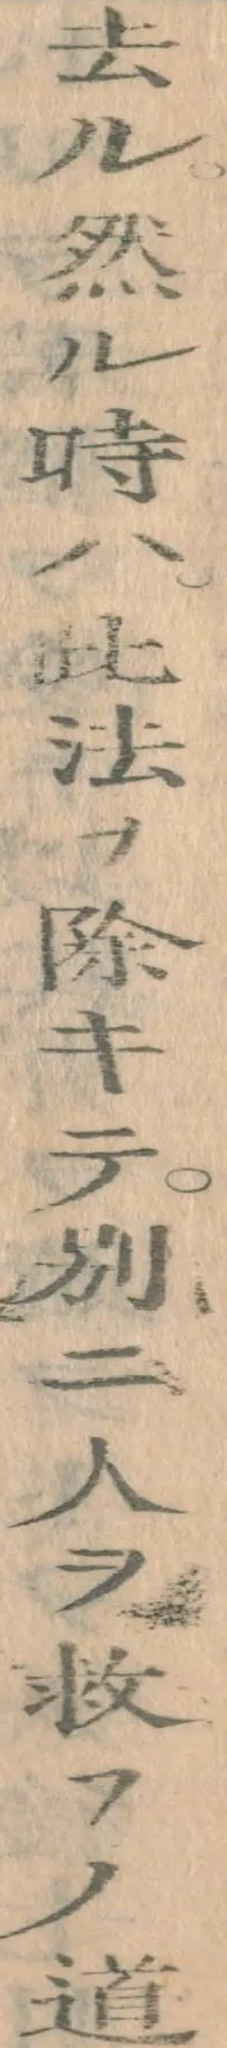去ル。然ル時ハ。此法ヲ除キテ。別ニ人ヲ救フノ道
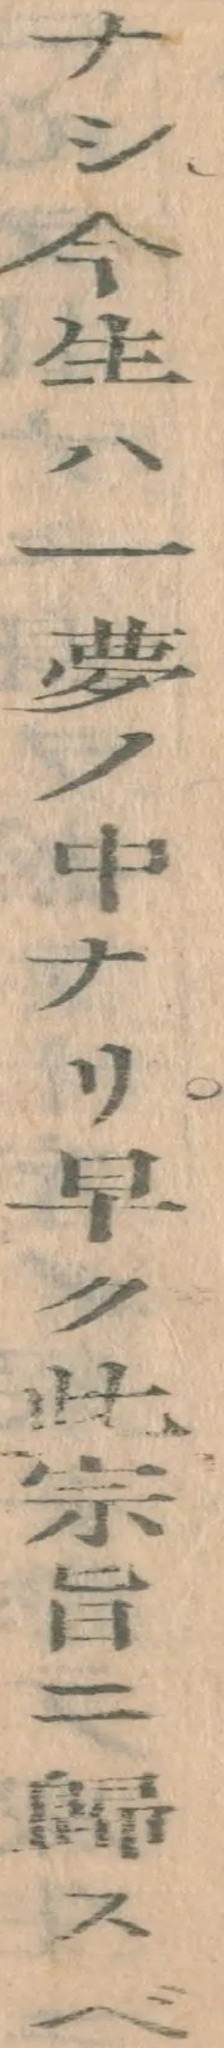ナシ。今生ハ一夢ノ中ナリ。早ク此宗旨ニ帰スベ
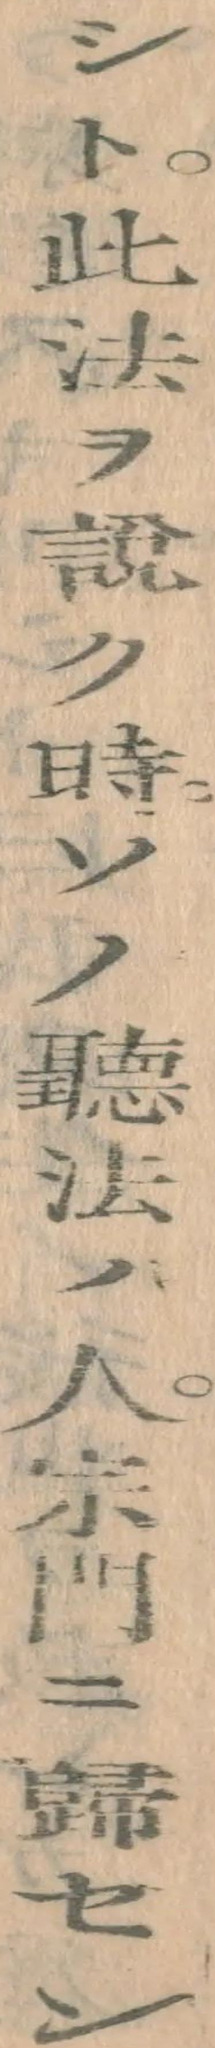シト。此法ヲ説ク時。ソノ聴法ノ人。宗門ニ帰セン
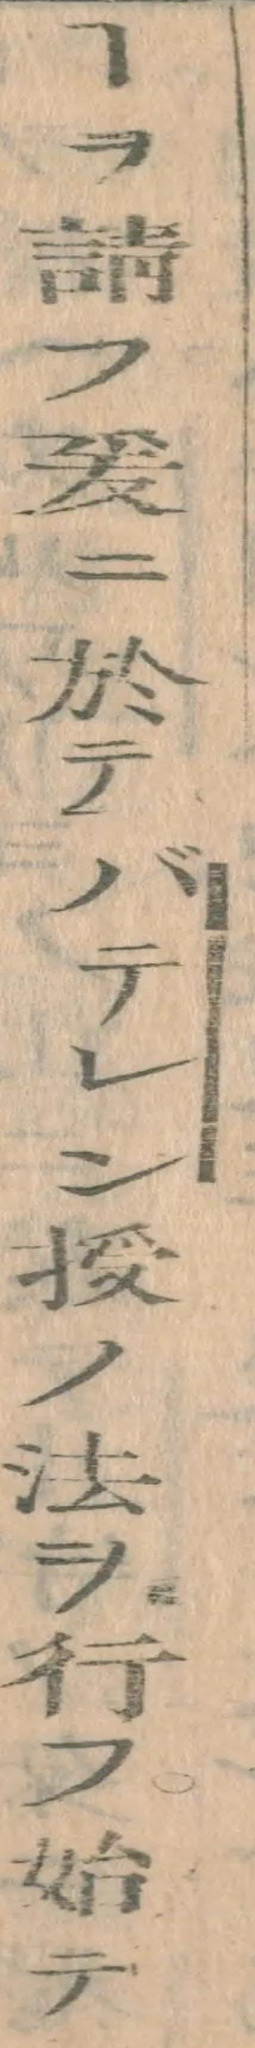ヿヲ請フ爰ニ於テバテレン授ノ法ヲ行フ。始テ
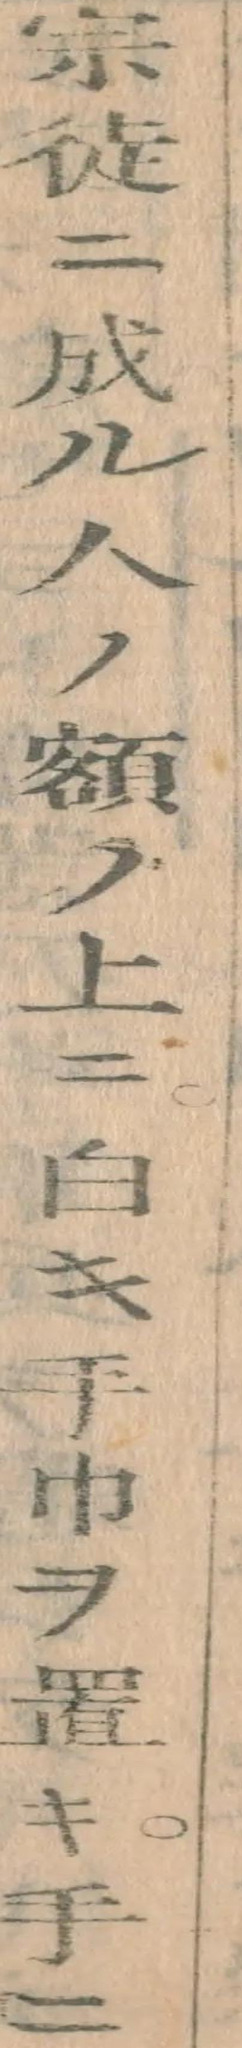宗徒ニ成ル人ノ額ノ上ニ。白キ手巾ヲ置キ。手ニ
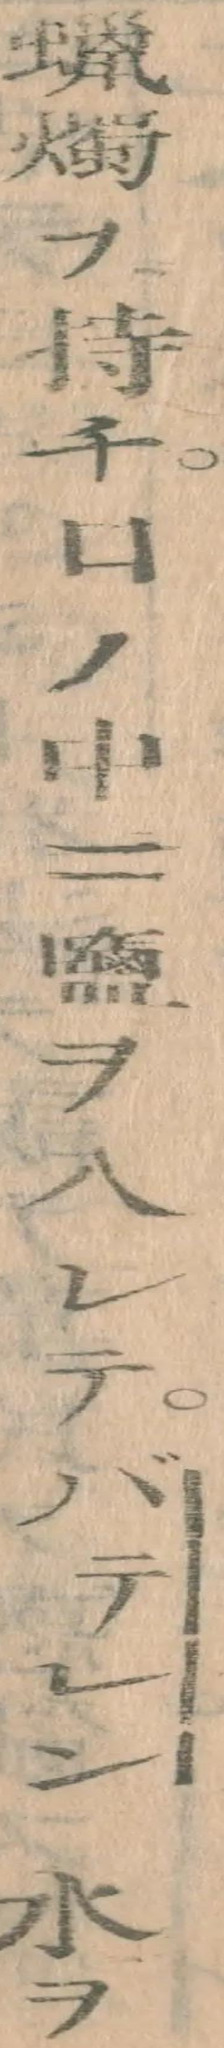蝋燭ヲ持チ。口ノ中ニ塩ヲ入レテ。バテレン水ヲ
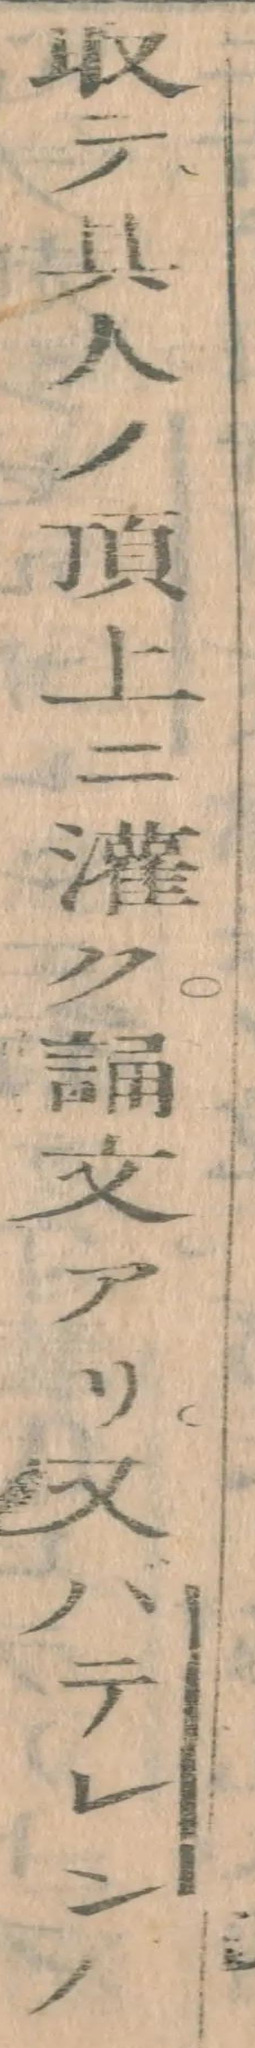取テ。其人ノ頂上ニ灌ク。誦文アリ。又バテレンノ
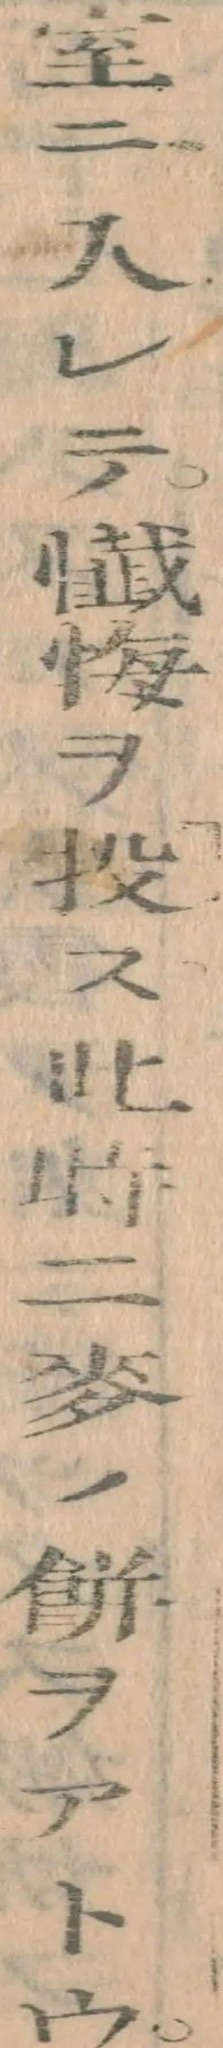室ニ入レテ。懺悔ヲ投ス。此時ニ麦ノ餅ヲアトウ。
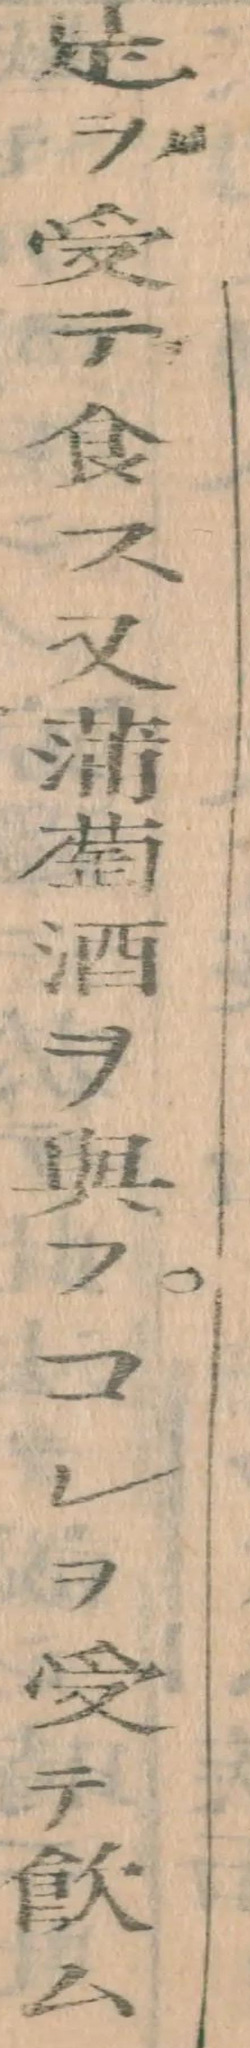是ヲ受テ食ス又蒲萄酒ヲ与フ。コレヲ受テ飲ム
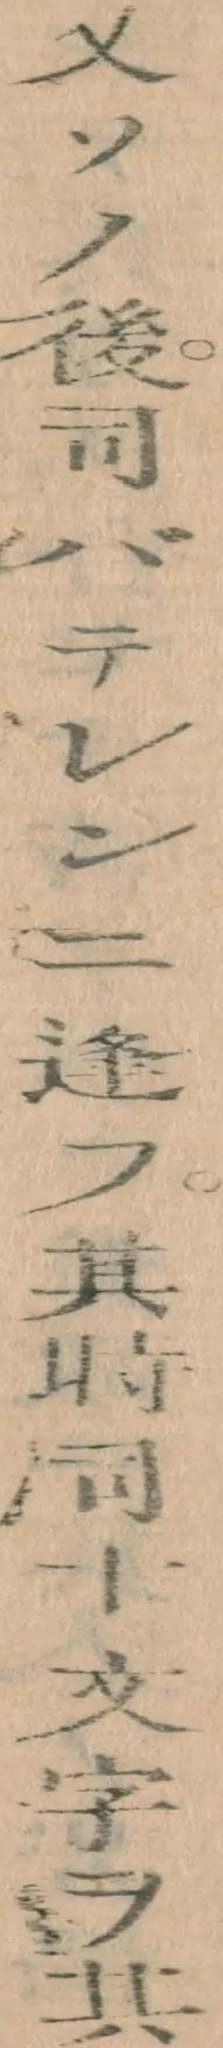又ソノ後。司バテレンニ逢フ。其時司十文字ヲ其
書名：南蛮寺興廃記
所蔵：国立国会図書館 National Diet Library, JAPAN
